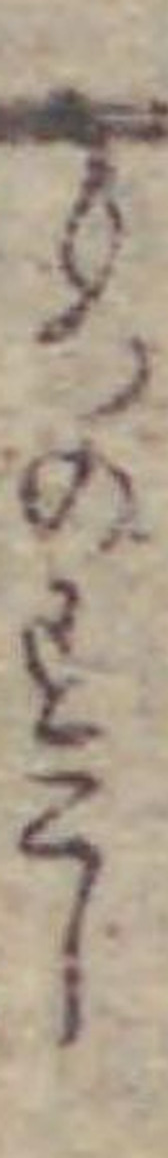もつのすこし
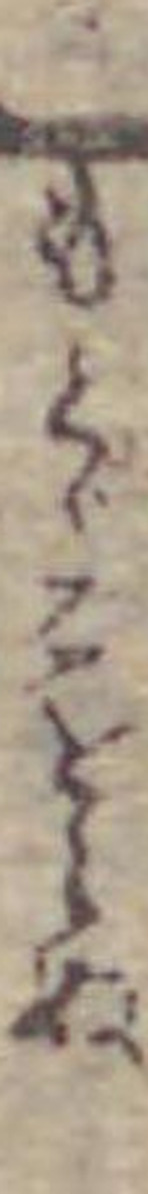もとゞこをらぬ
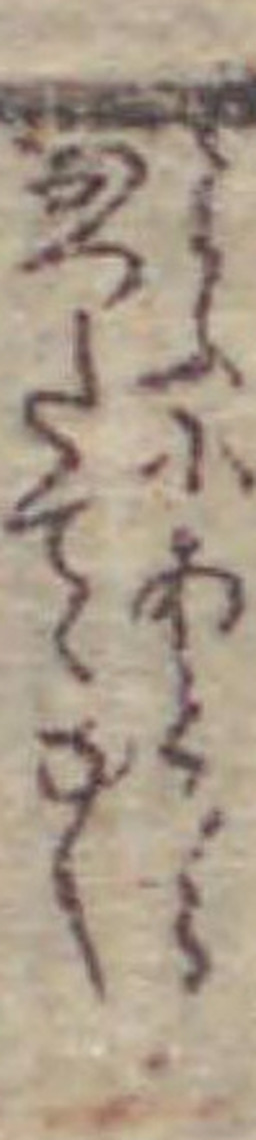おつたてゝゆく
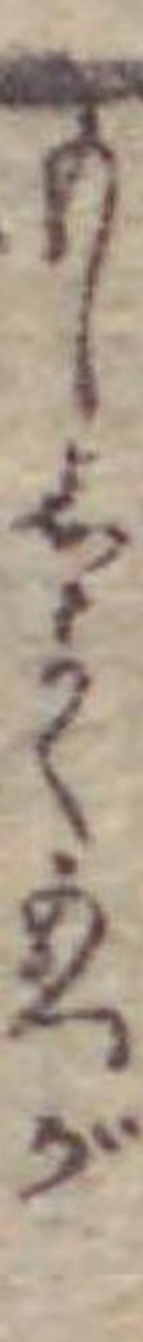もししよくもつが
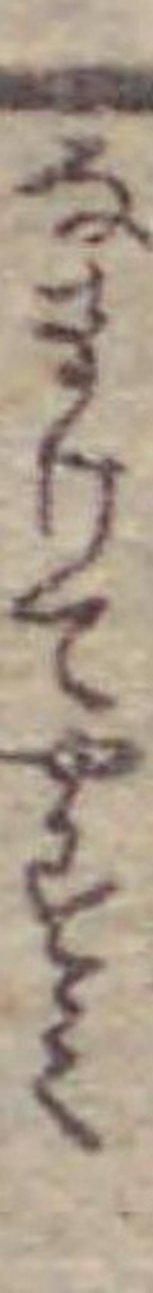なまけてやすみ
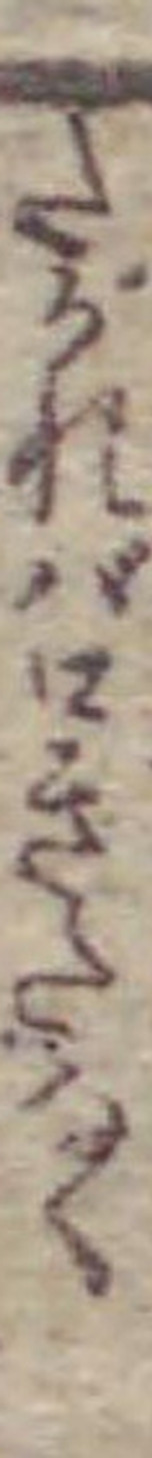たがれば口きたなく
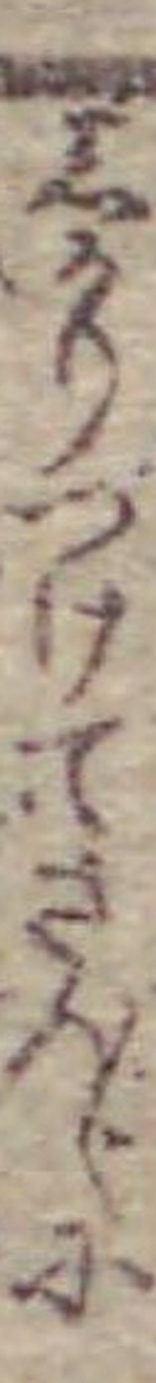しかりつけてさん〴〵に
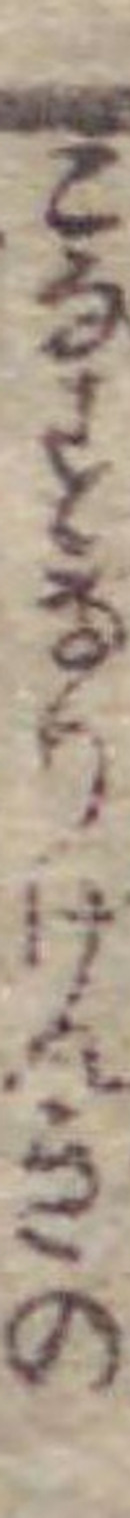こなすなりげんきの
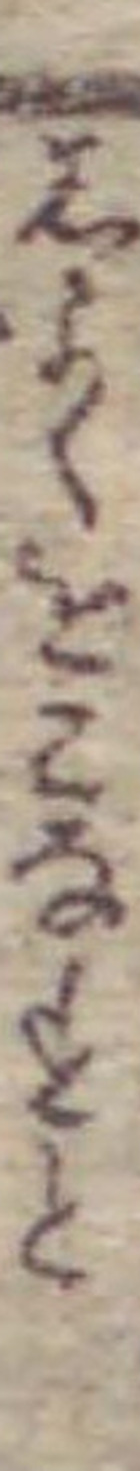しよくをこなすと
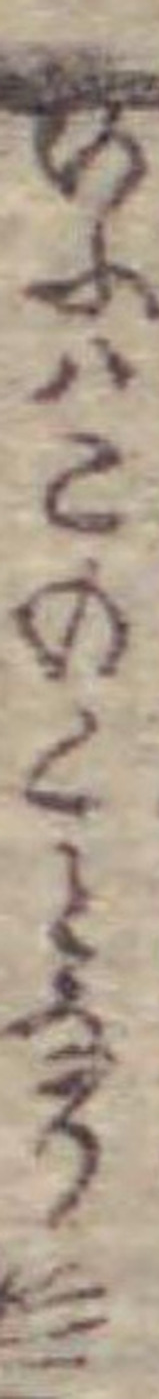いふはこのことなり

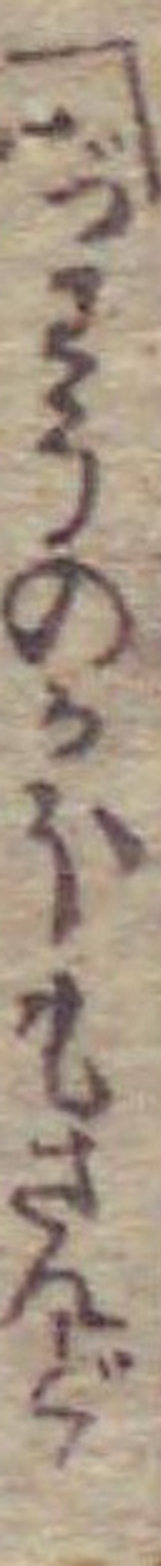〽ぢわうのかほもさんど
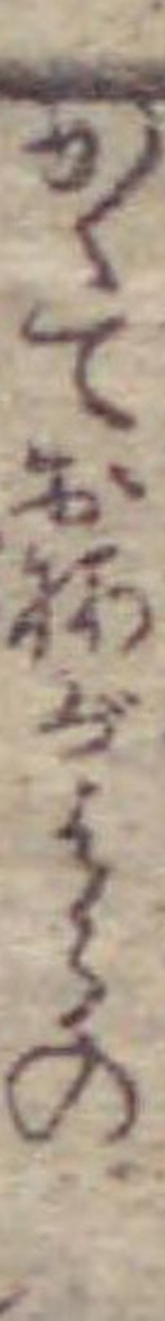かくてお梅がはらの
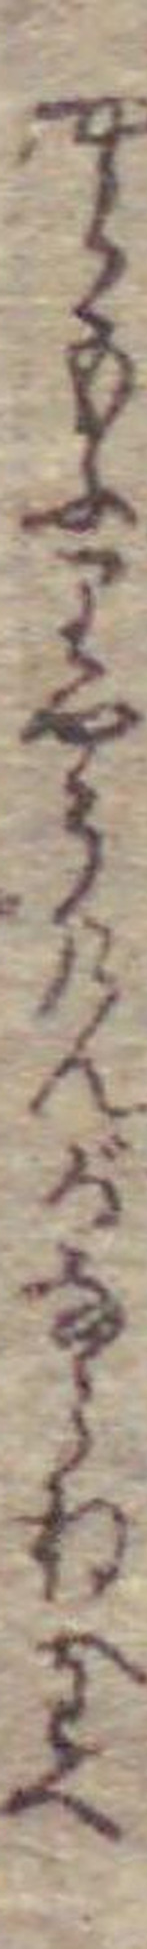やらもふりやうけんがならねへわへ
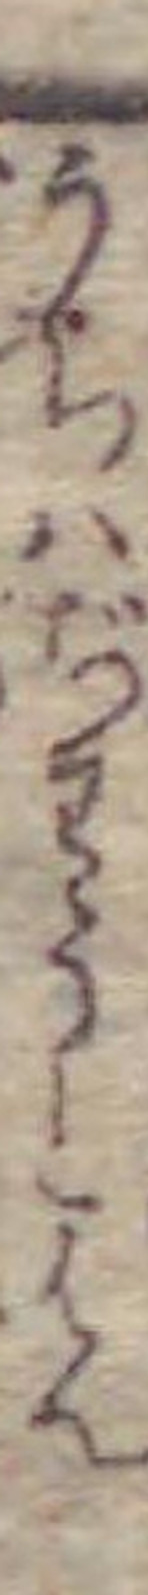うちはぢわうとはん
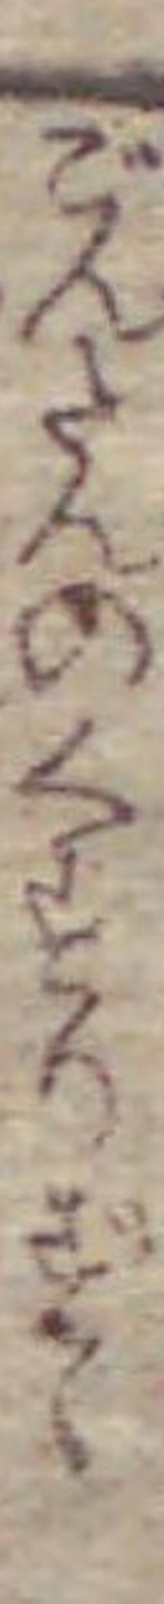ごんたんのくすりずく
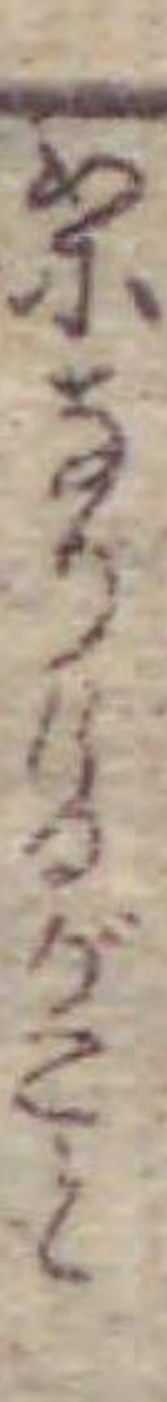めになりけるがこと
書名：鼻下長生薬 : 3巻
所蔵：国立国会図書館 National Diet Library, JAPAN
